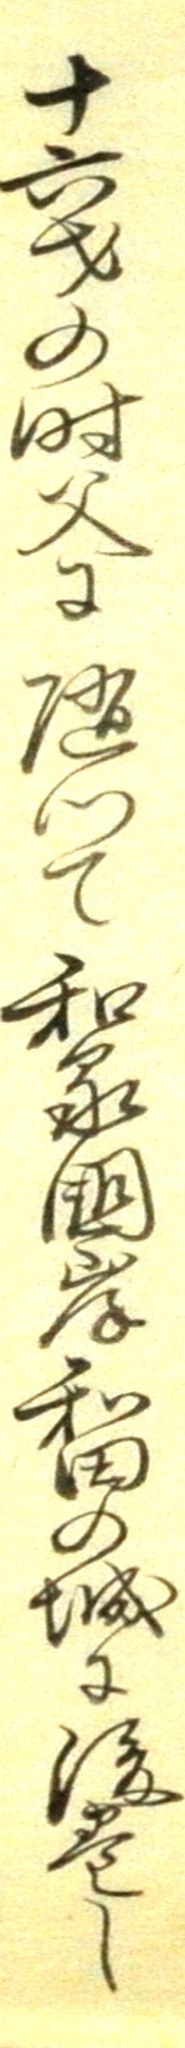十六才の時父に随つて和泉国岸和田の城に後巻し
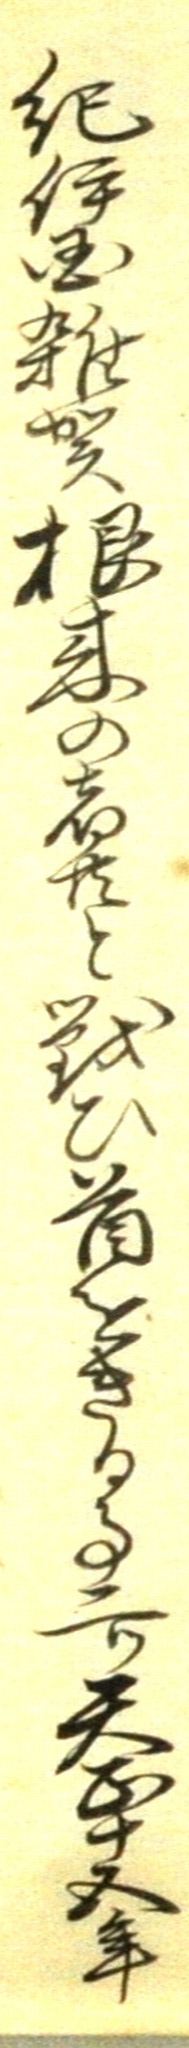紀伊国雑賀根来の者共と戦ひ首をきる事二ッ天正十五年
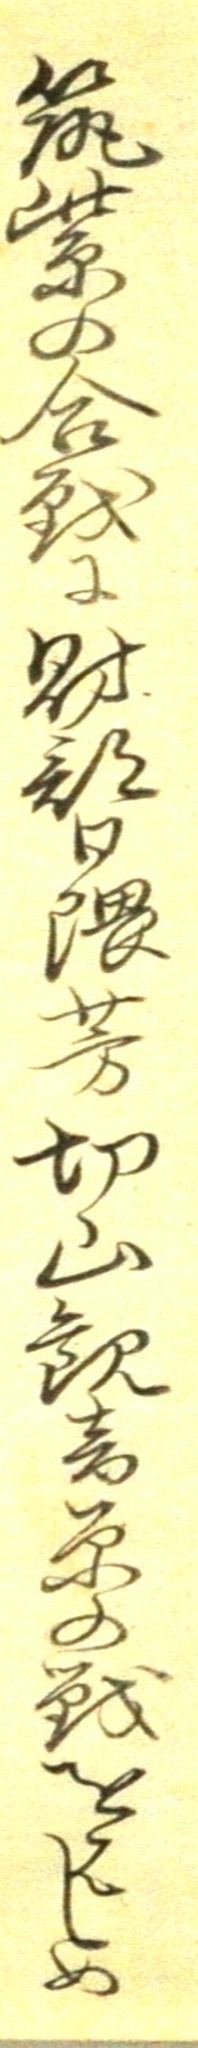筑紫の合戦に財部日隈芳切山観音原の戦をはしめ
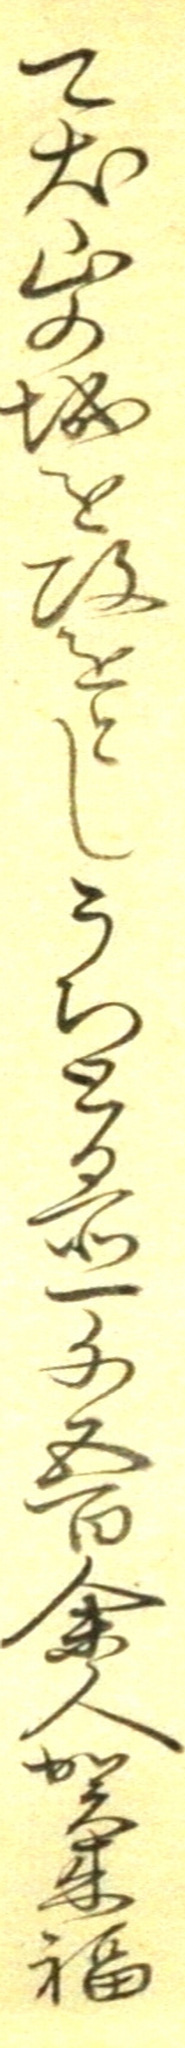て犬山の城を攻をとしうちとる所一千五百余人賀来福
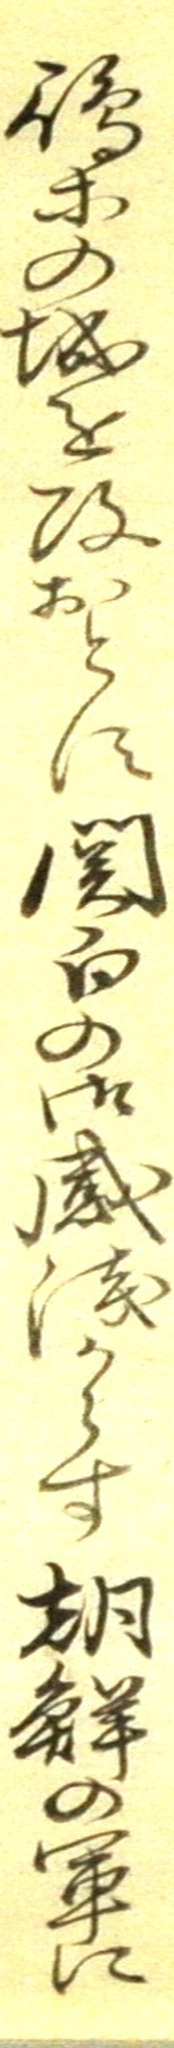島等の城を攻おとす関白の御感浅からす朝鮮の軍に
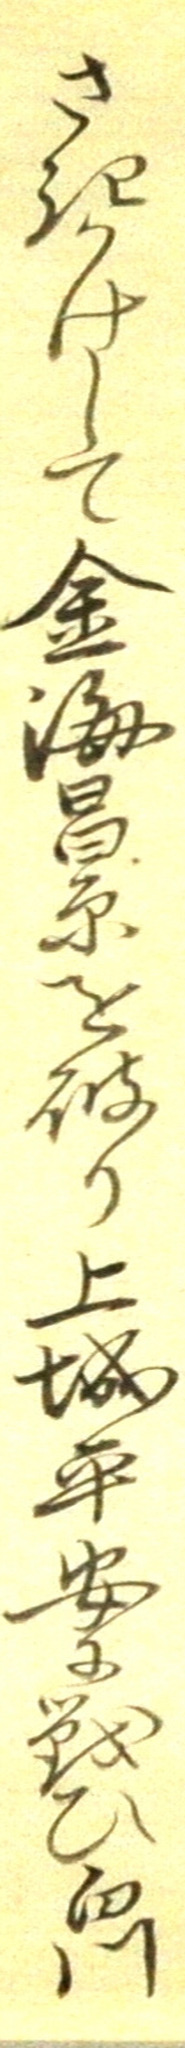さきかけして金海昌原を破り上城平安に戦ひ白川
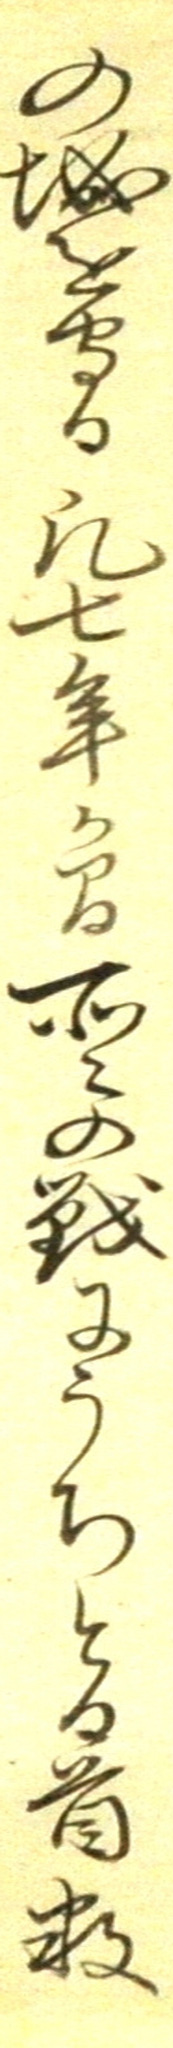の城を守る凡七年か間所々の戦にうちとる首数
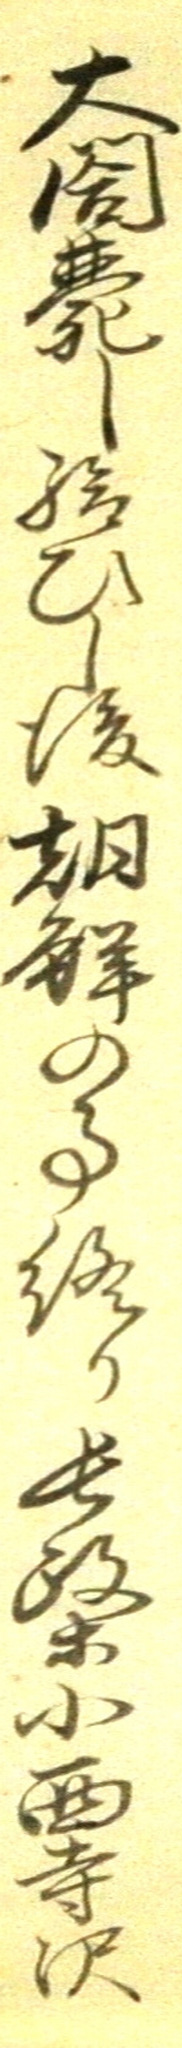太閤薨し給ひし後朝鮮の事終り長政等小西寺沢
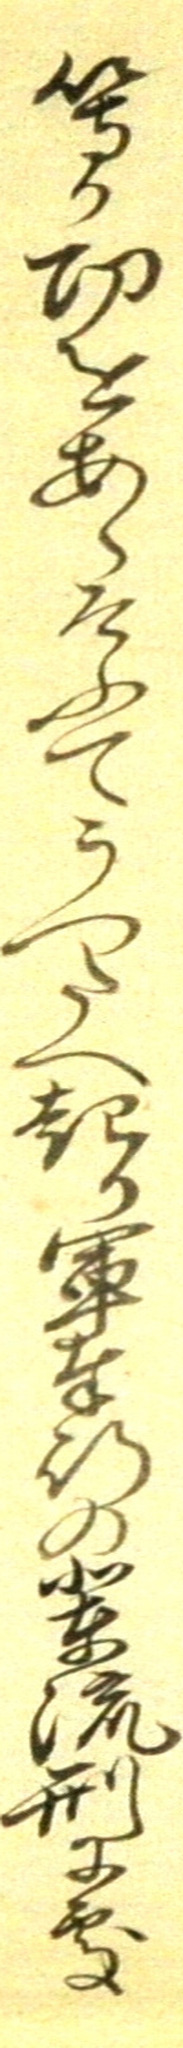等か功をあらそふてうつたへ起り軍奉行の輩流刑に処
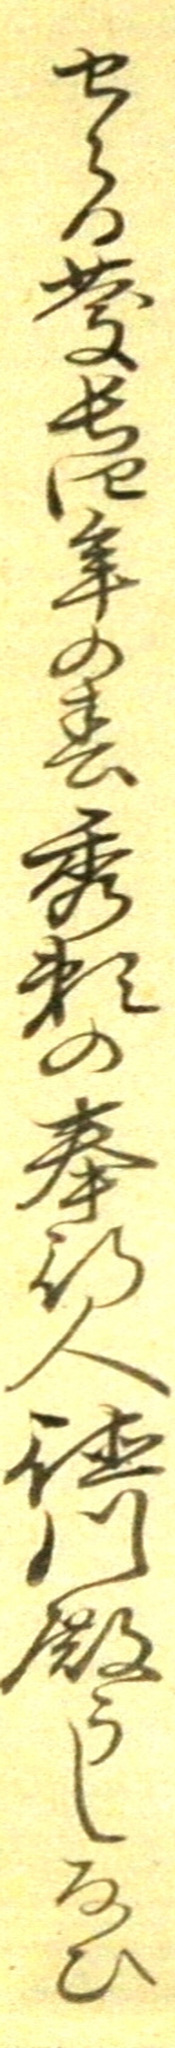せらる慶長四年の春秀頼の奉行人徳川うしなひ
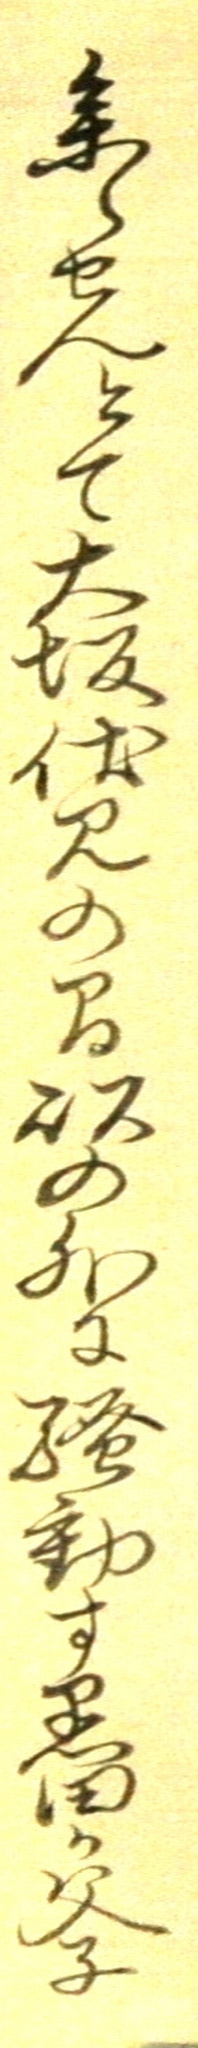参らせんとて大坂伏見の間以の外に騒動す黒田か父子

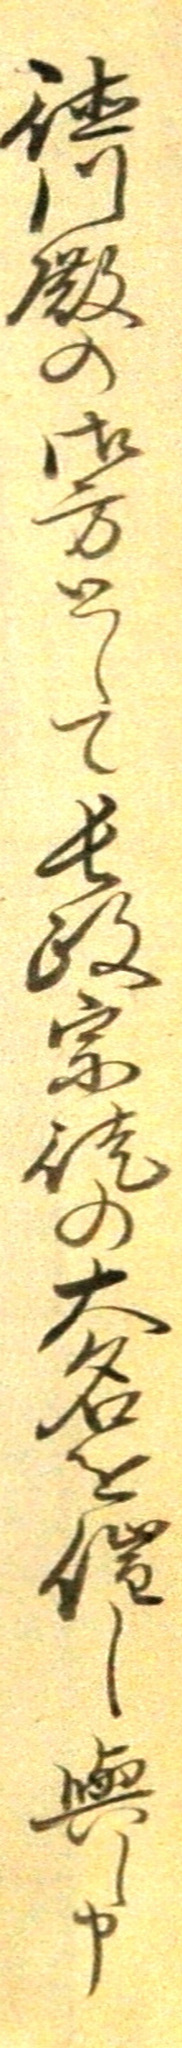徳川殿の御方として長政宗徒の大名を催し與し申
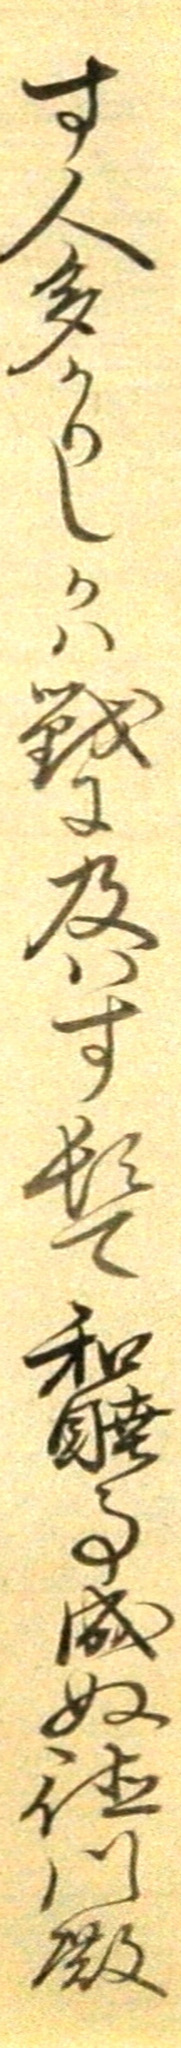す人多かりしかは戦に及はす頓て和睦事成ぬ徳川殿
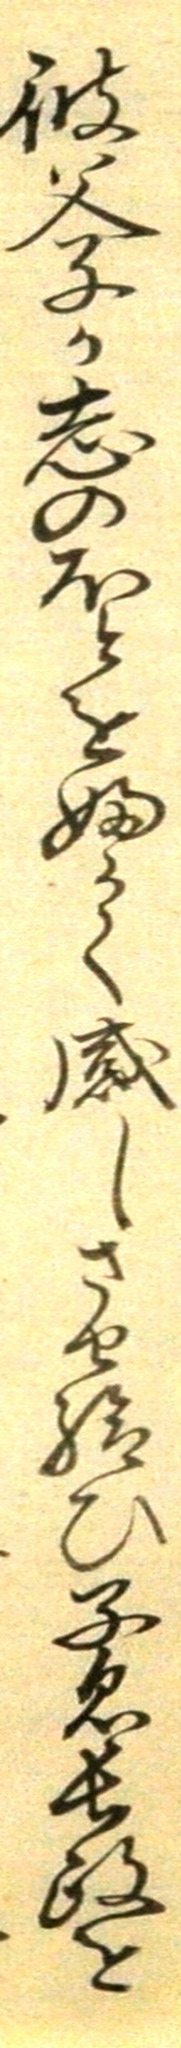彼父子か志のほとをふかく感しさせ給ひ子息長政を
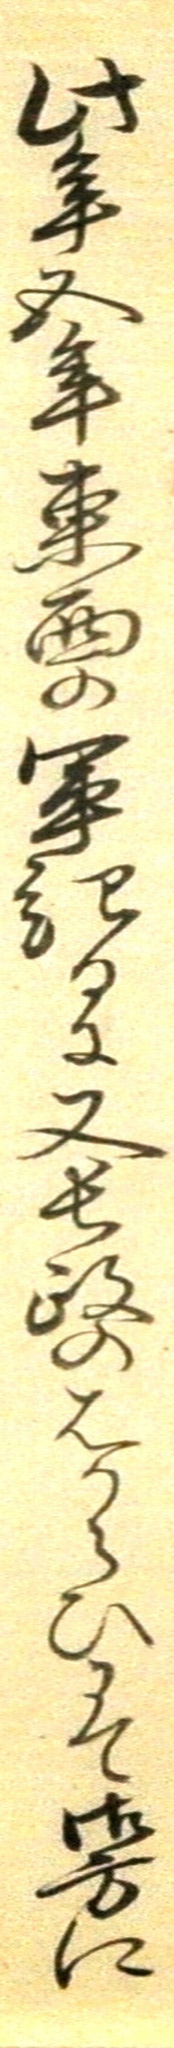此年五年東西の軍起るに又長政のはからひにて御方に
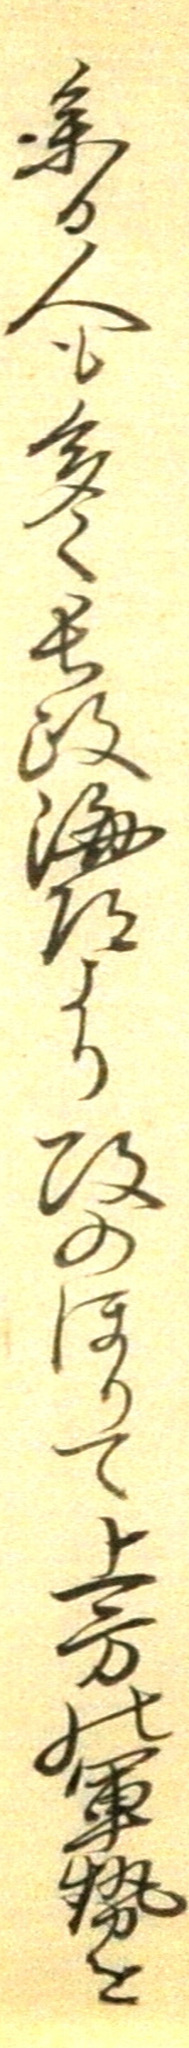参る人も多く長政海道より攻のほりて上方の軍勢を
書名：藩翰譜（七・上）
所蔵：伊那市立高遠町図書館・合同会社AMANE
